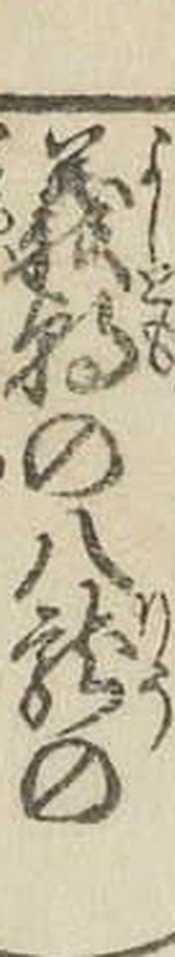義朝の八龍の
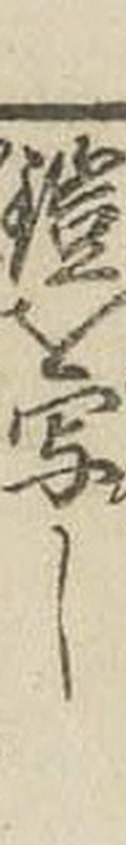鎧を写し
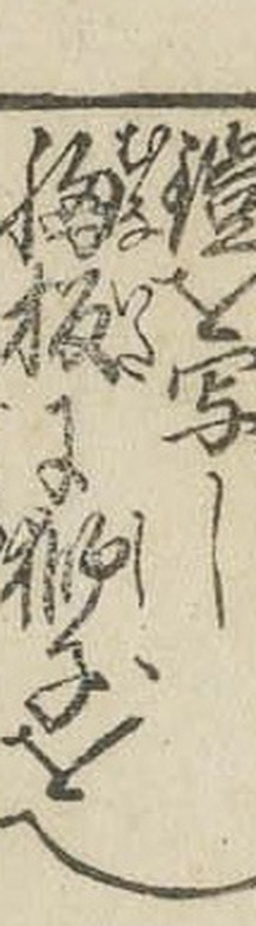胸板に獅子を
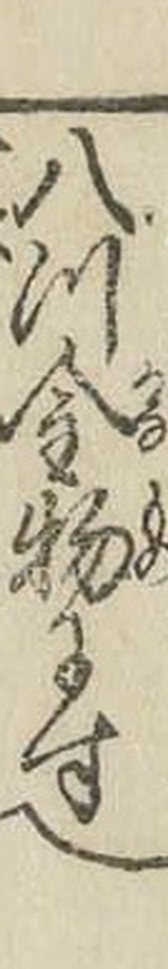八つ金物にす
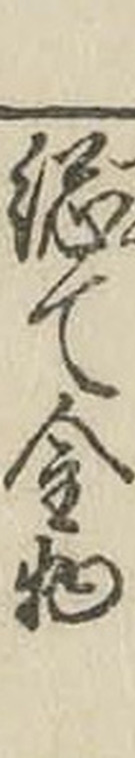総て金物
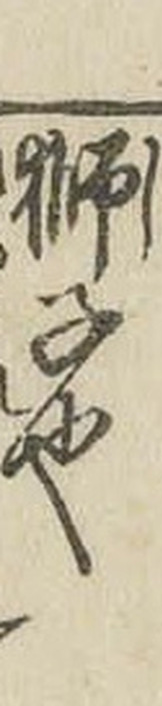獅子也
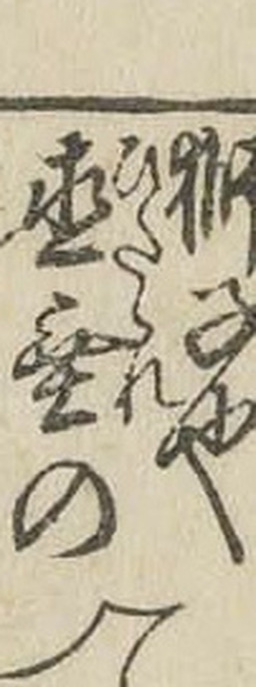直垂の
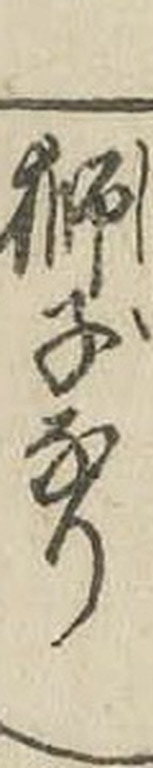獅子なり
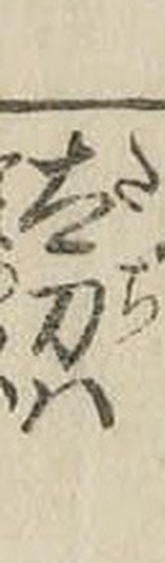太刀は
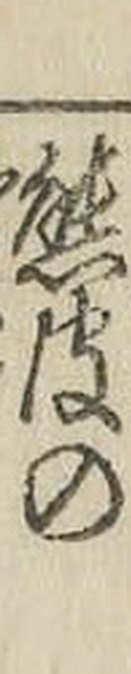熊皮の

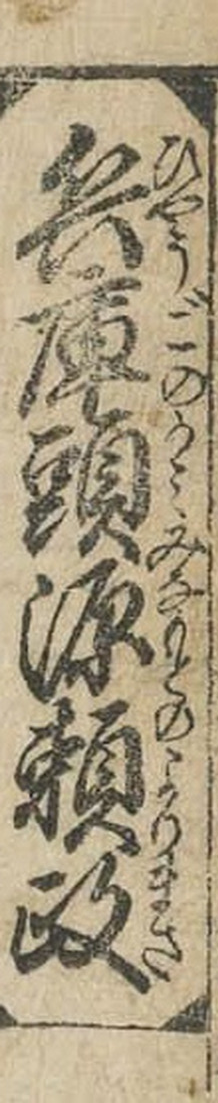兵庫頭源頼政
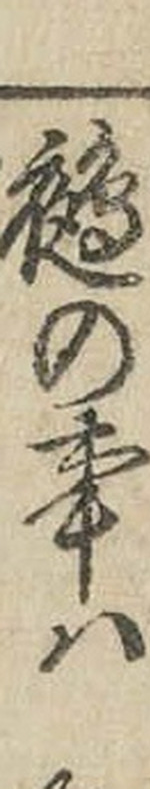鵺の事は
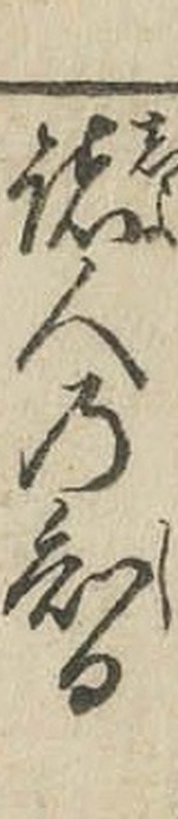諸人の知る
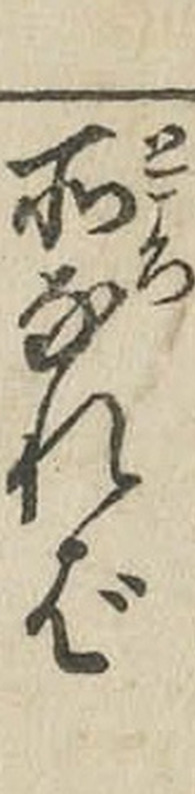所なれば
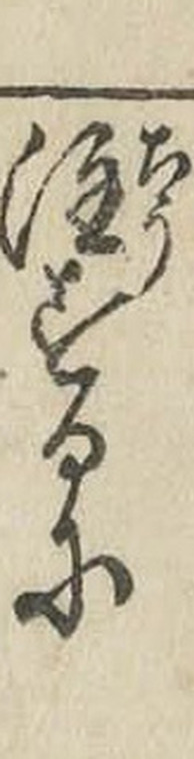注するに
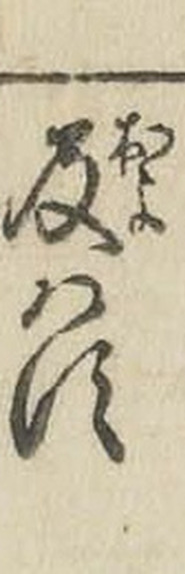及はす
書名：絵本写宝袋 9巻 3之巻
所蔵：東京学芸大学教育コンテンツアーカイブ
